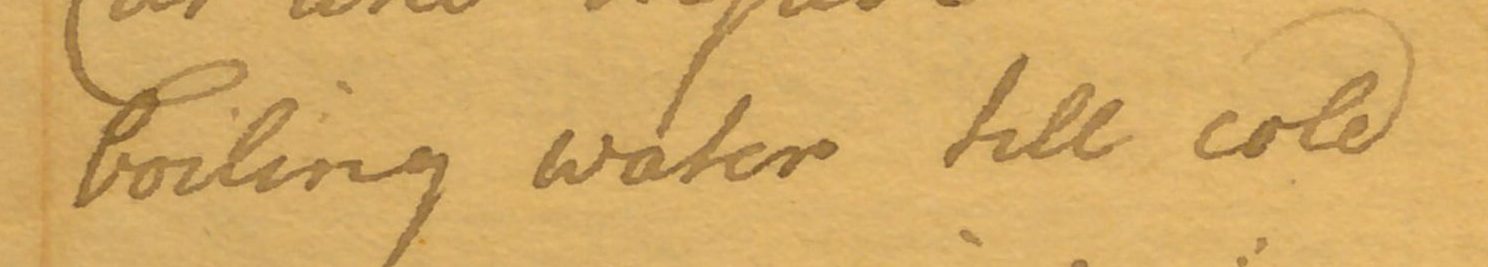boiling water till cold
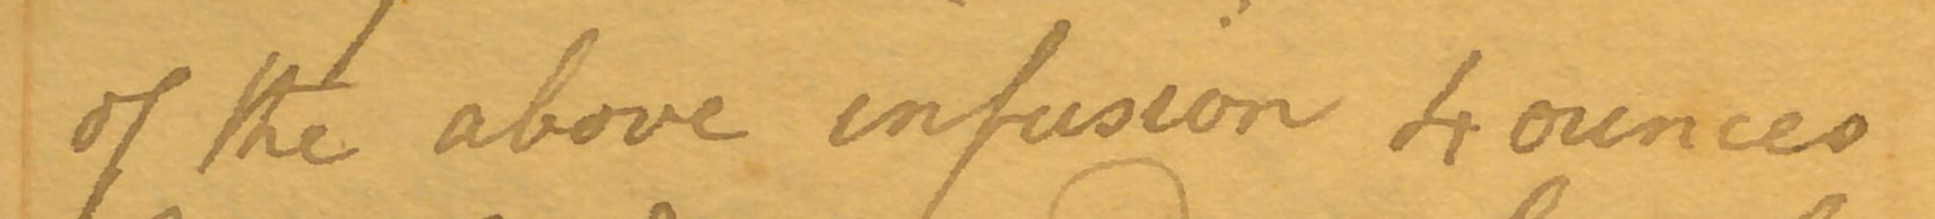of the above infusion 4 ounces
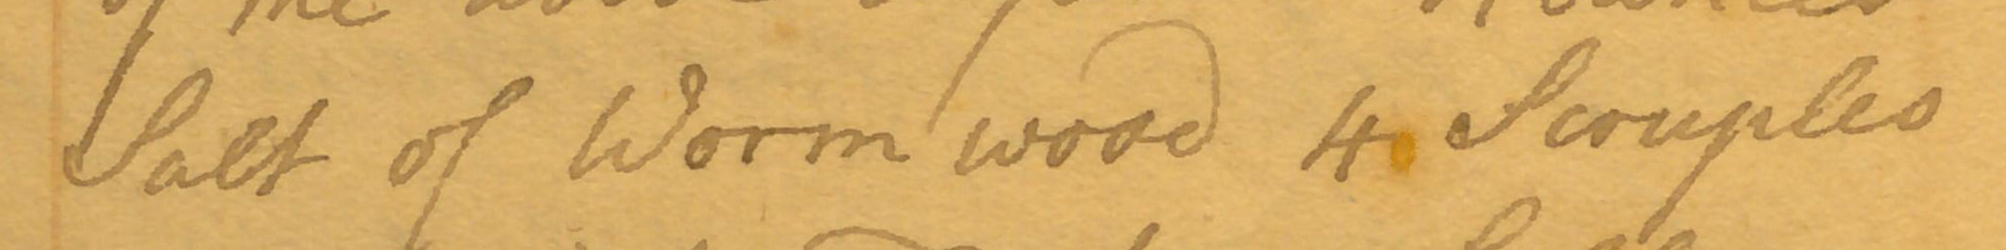salt of worm wood 4 Scruples
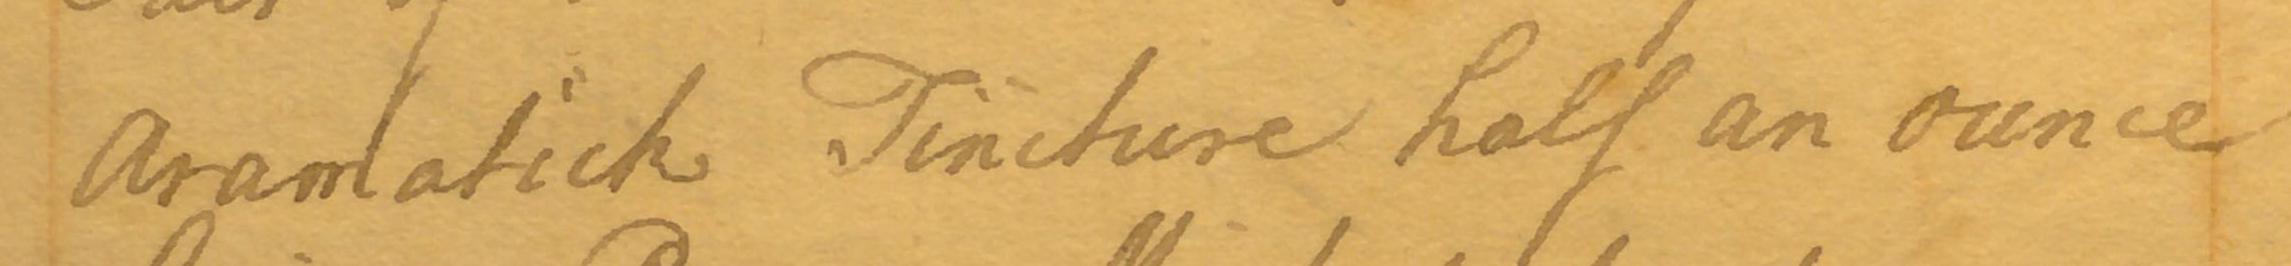Aramatick Tincture half an ounce
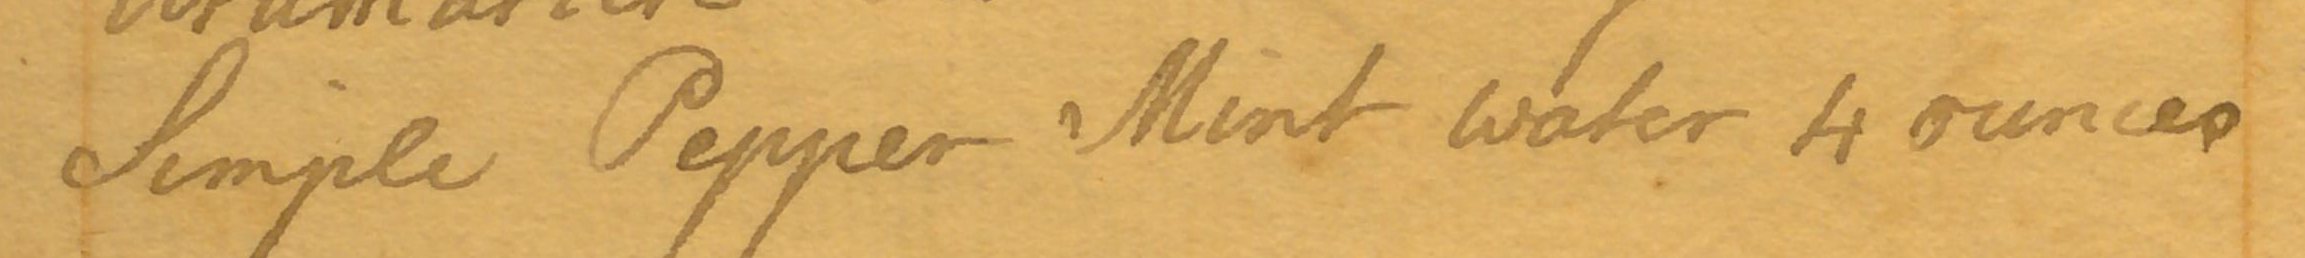simple Pepper Mint water 4 ounces
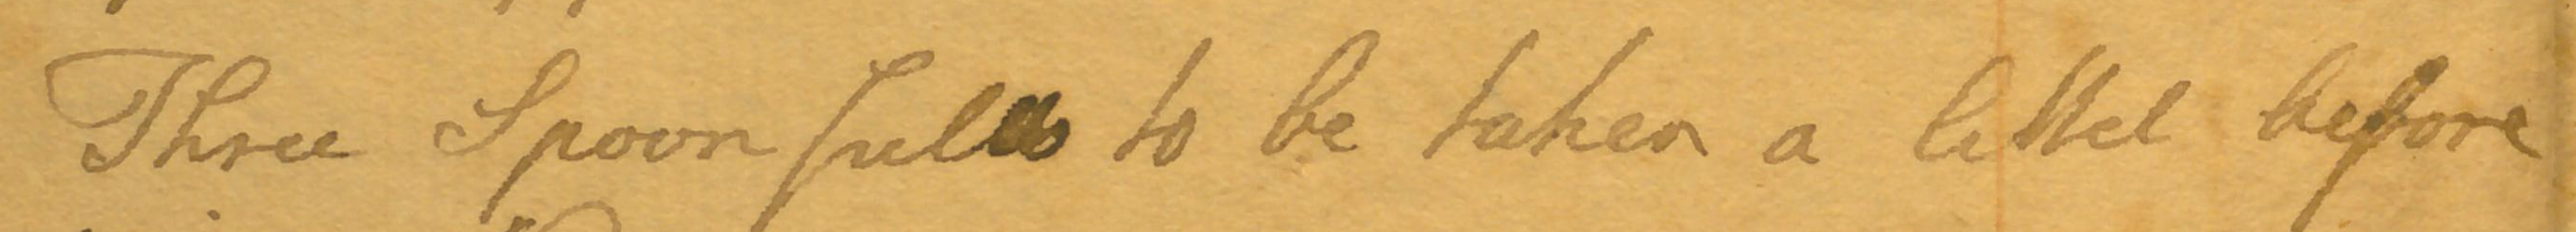Three spoon fulls to be taken a littel before
